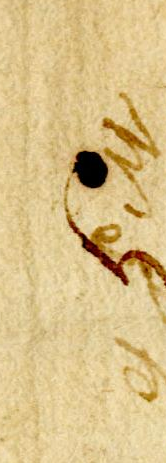M G^ts
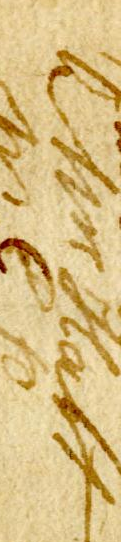M^rs Hart
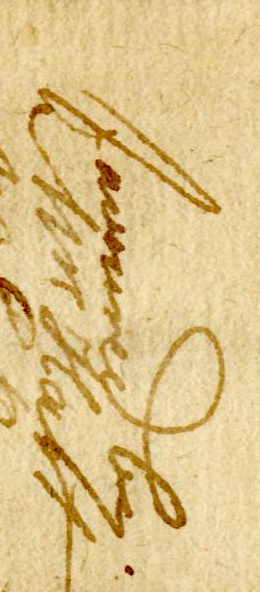favoured by
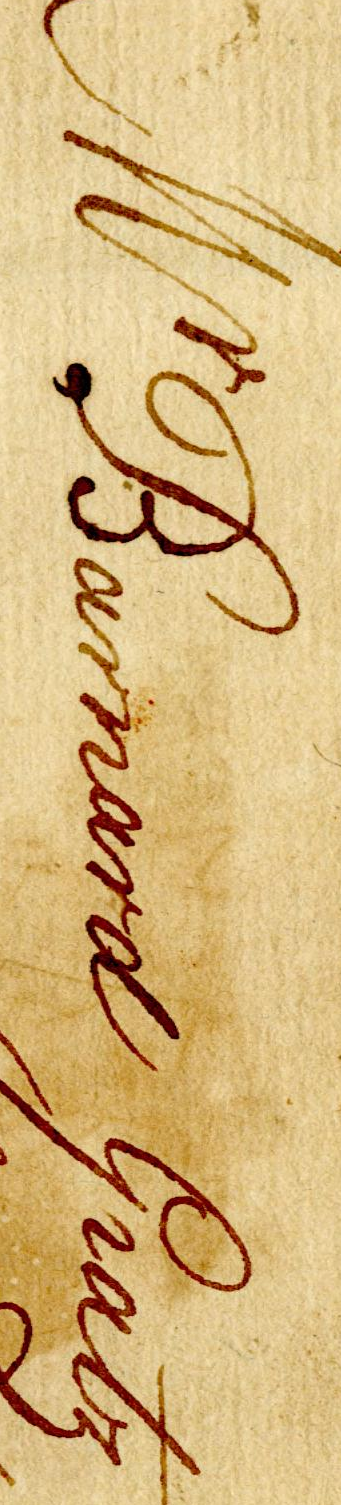M^r Barnard Gratz
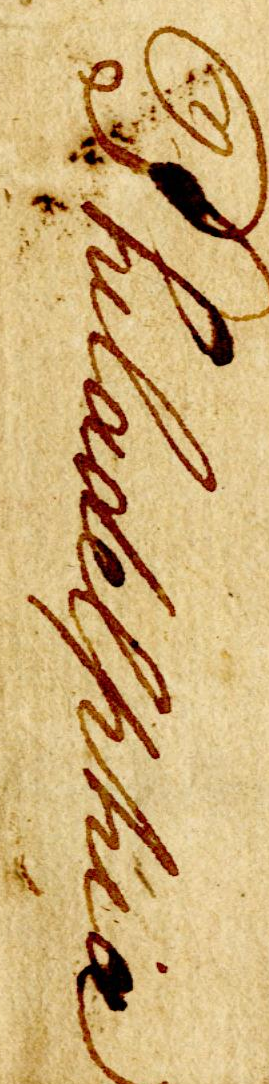Philadelphia
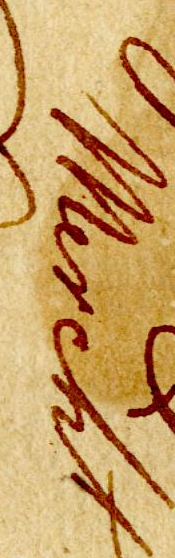Merch^t
